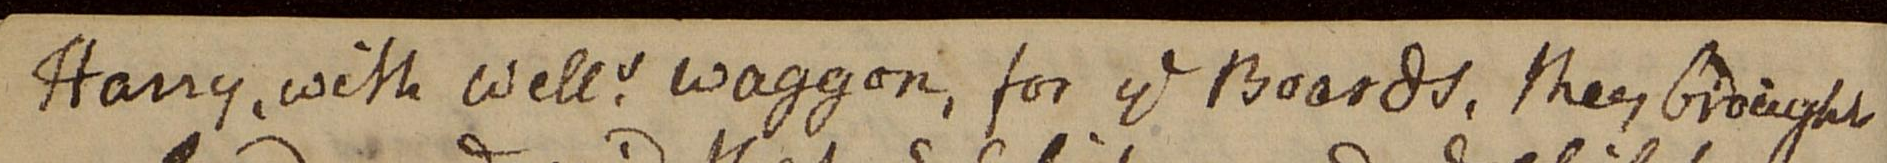Harry, with Well^s. waggon, for y^e Boards, they brought
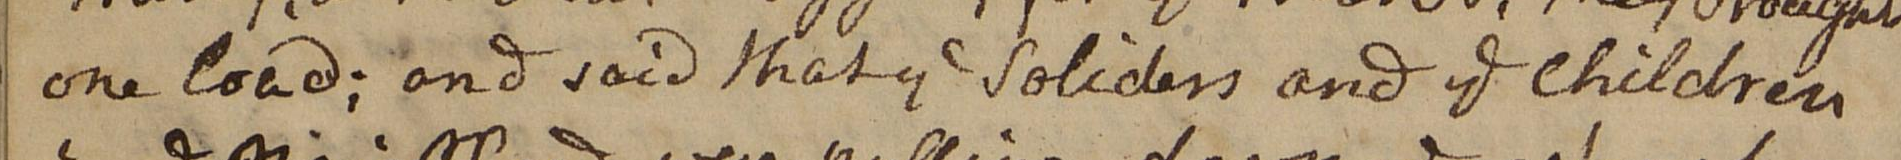one load; and said that y^e Soliders and y^e children
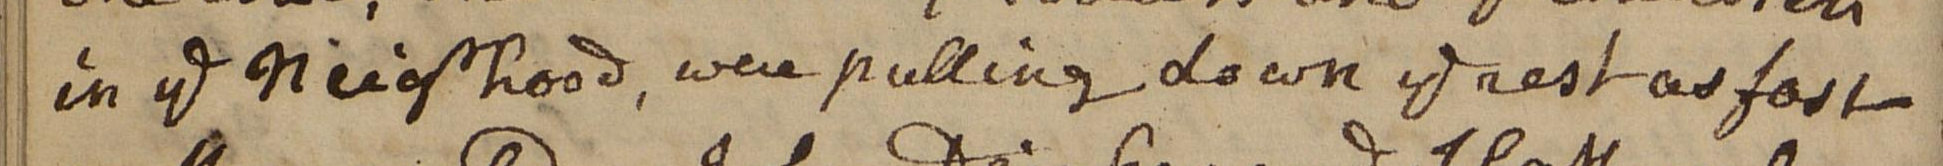in y^e Neigh^r hood, were pulling down y^e rest as fast
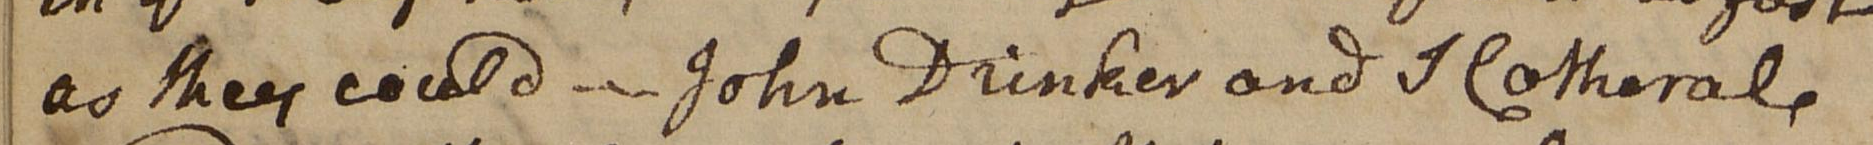as they could- John Drinker and I Caheral
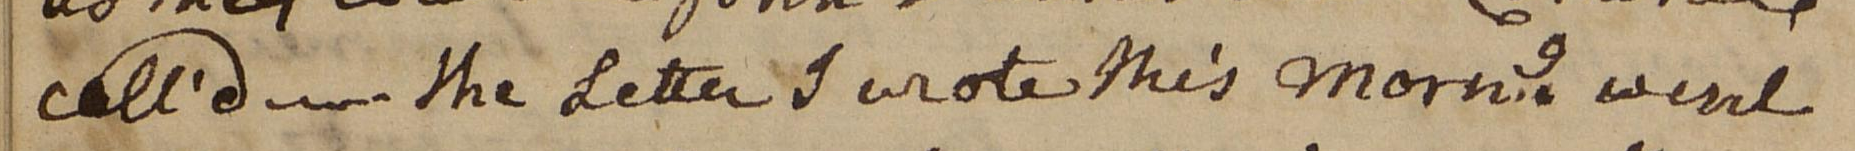call'd- the Letter I wrote this morn^g. went
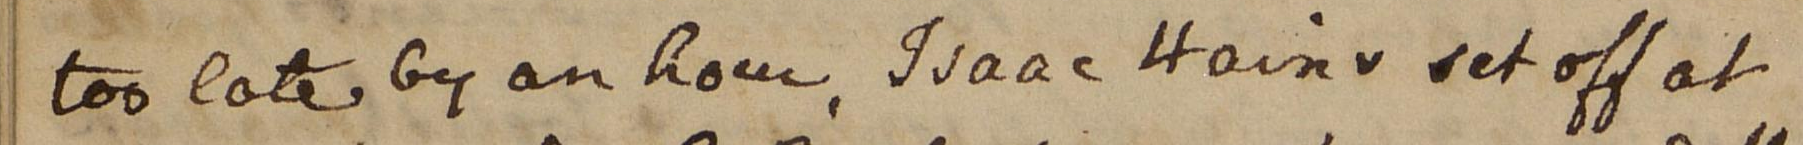too late by an hour, Isaac Hains set off at
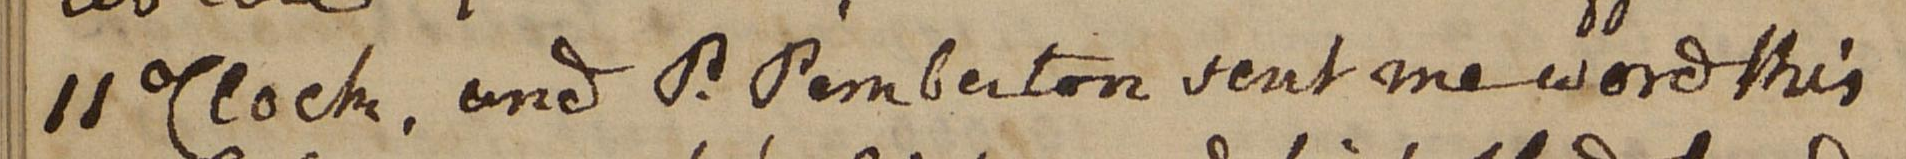11 ^oClock, and P. Pemberton sent me word this
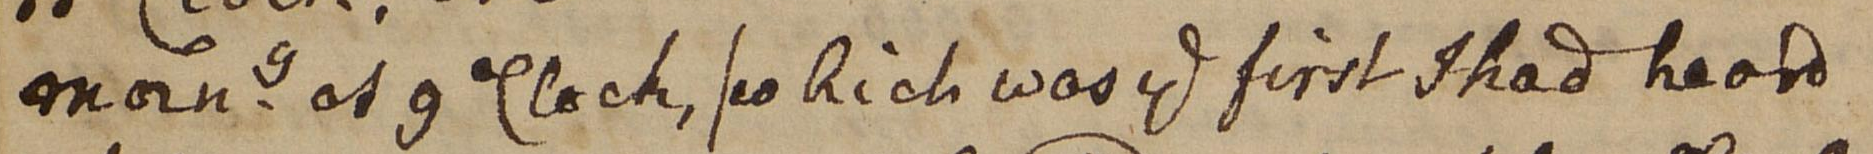morn^g. at 9 ^oClock, /which was y^e first I had heard
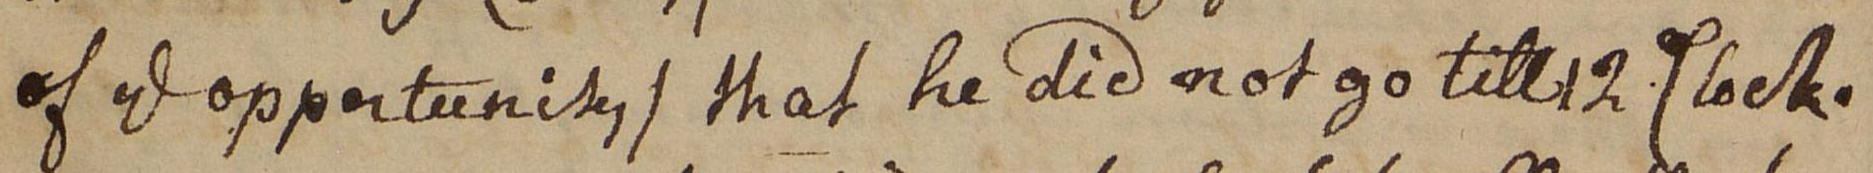of y^e opportunity/ that he did not go till 12 ^oClock.
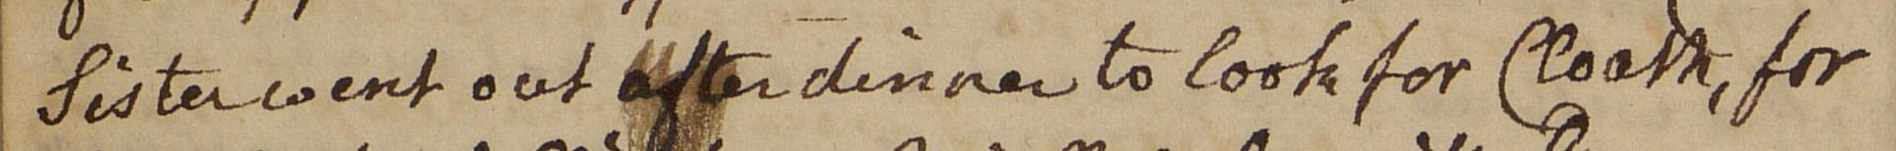Sister went out after dinner to look for Cloath, for
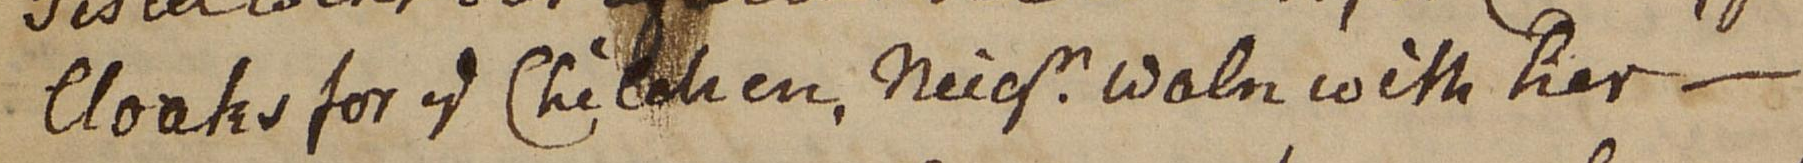Cloaks for y^e Children, Neigh^r. Waln with her-
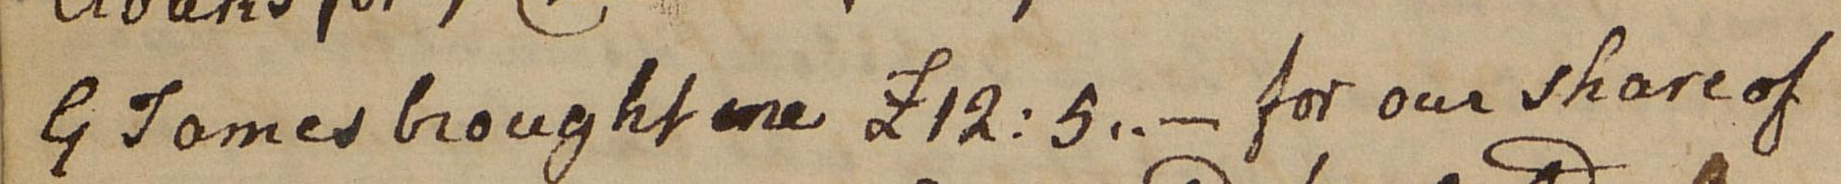G James brought one £12:5..- for our share of
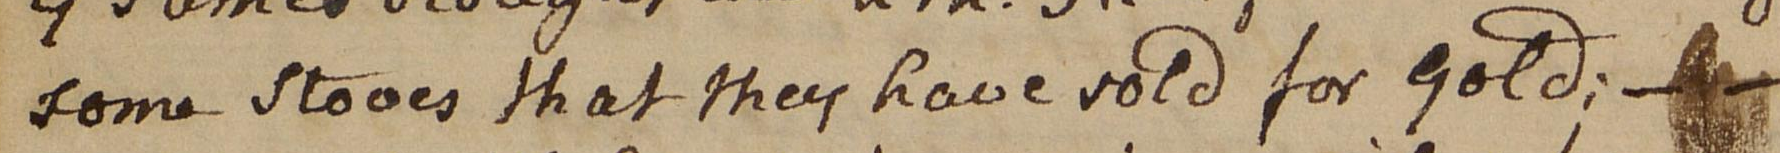some stoves that they have sold for Gold;-
